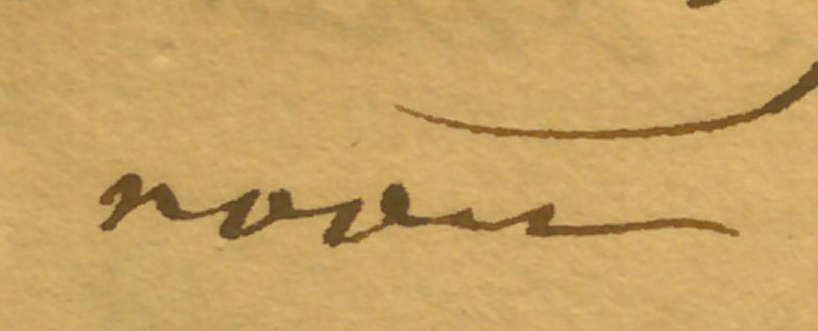none
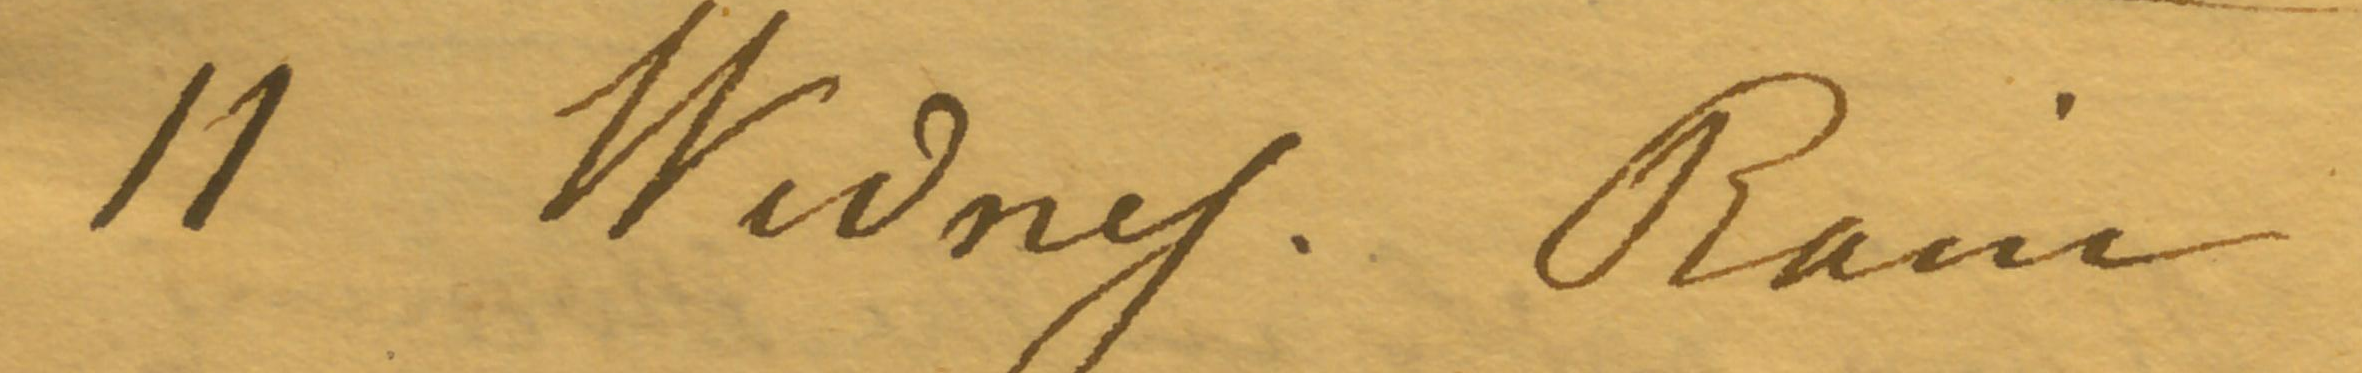11 Wednes. Rain
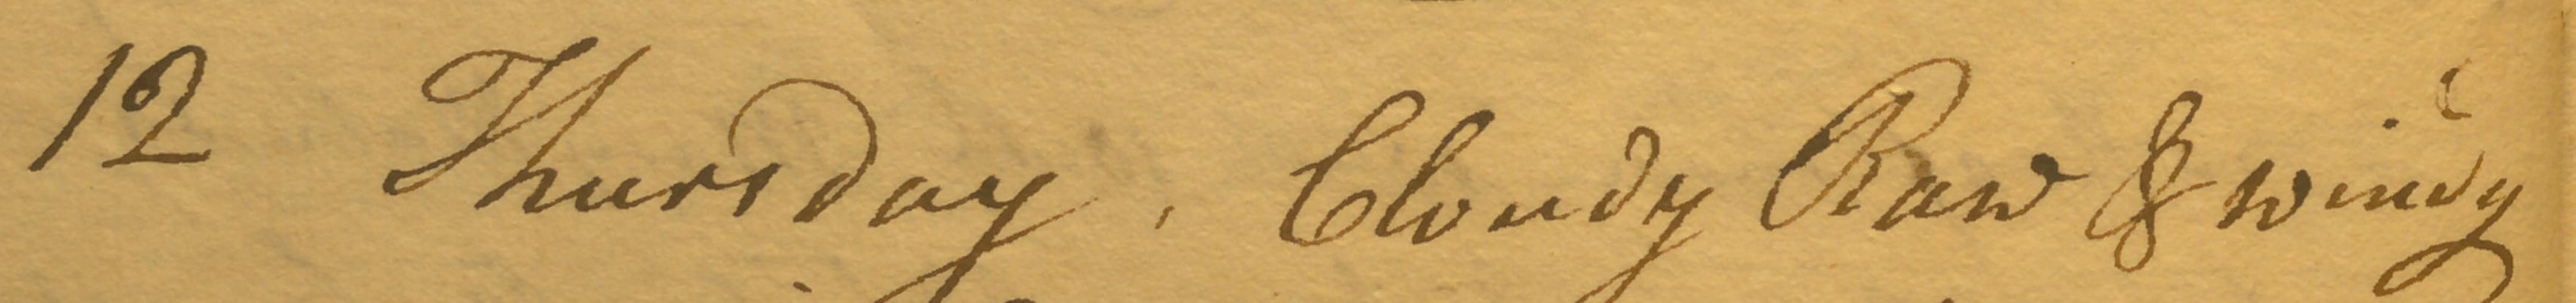12 Thursday. Cloudy Raw & windy
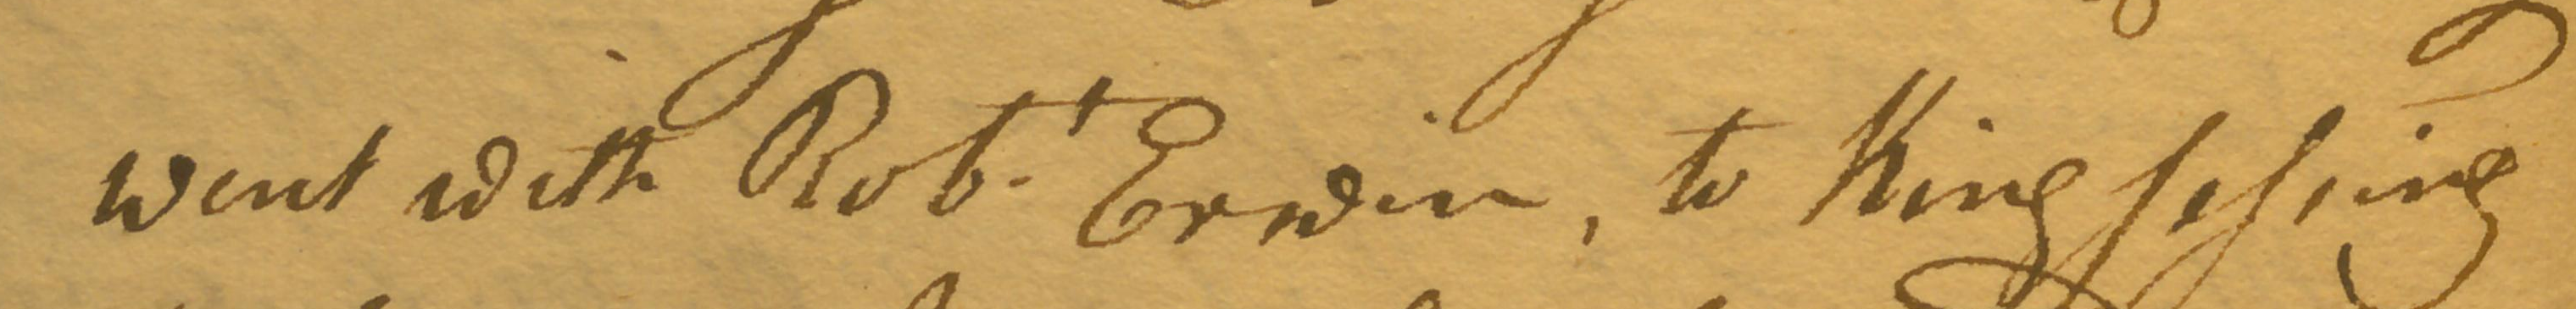went with Rob^t. Erwin to Kingsessing
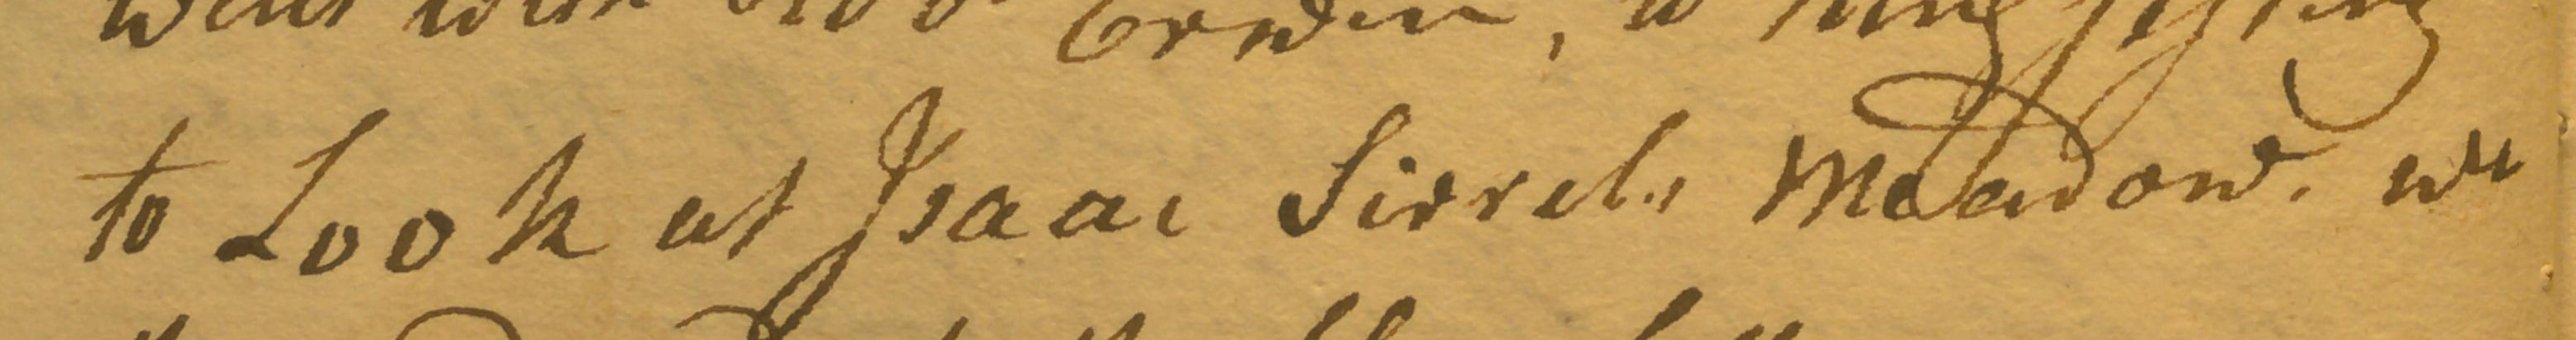1o Look at Isaac Sirrels Meadow. we
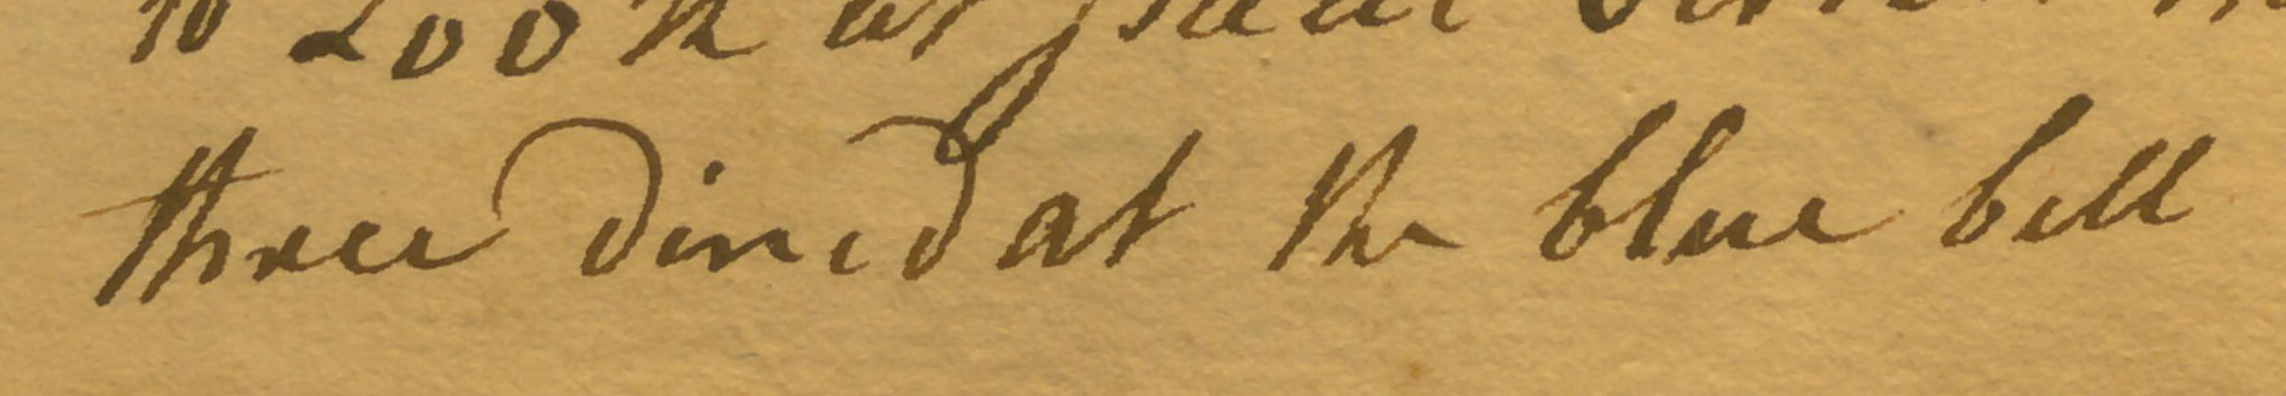three dined at the blue bell
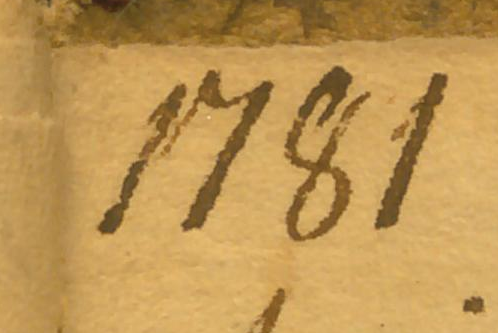1781
